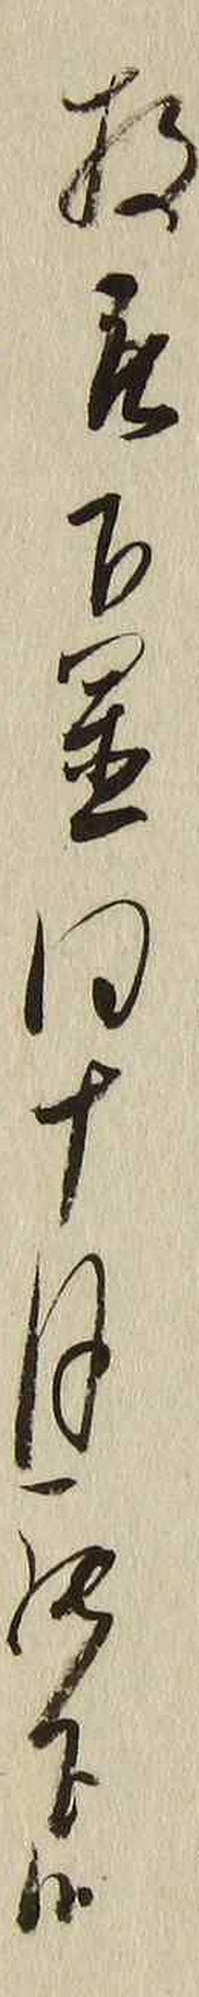枚被下置同十月罷下候
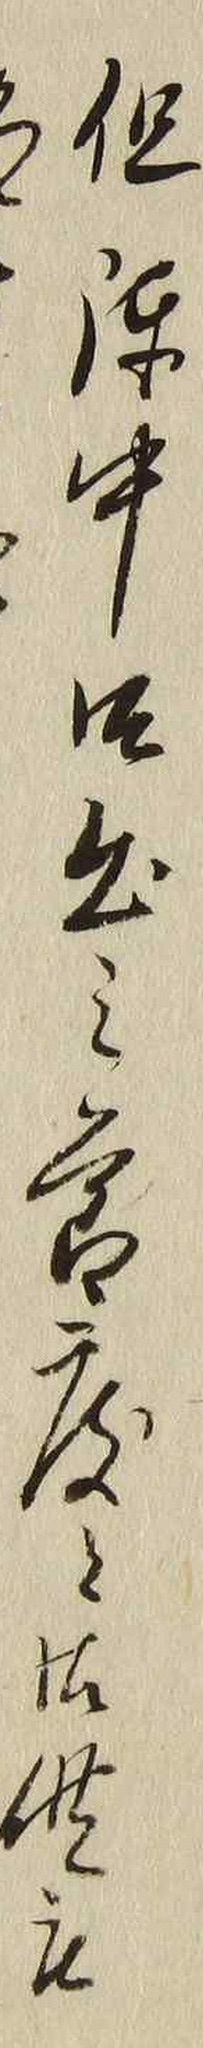但陣中御出之節度々御供被
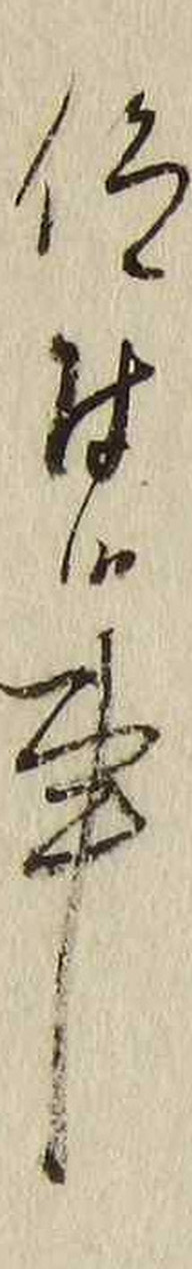仰付候事
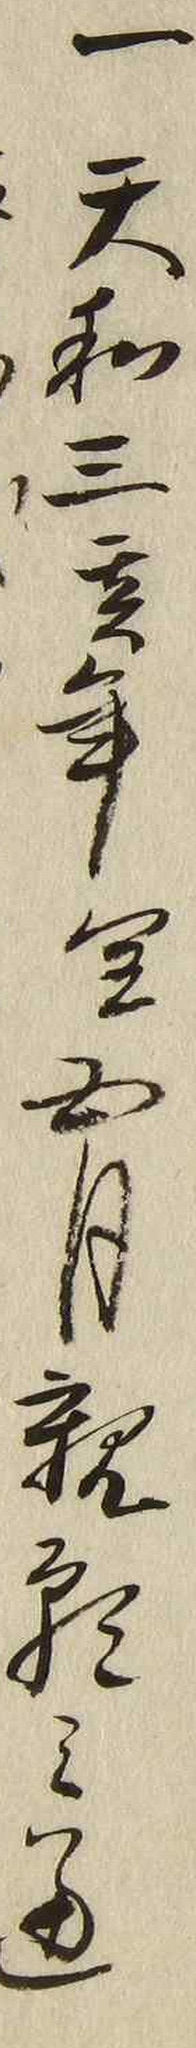一天和三亥年閏五月親願之通
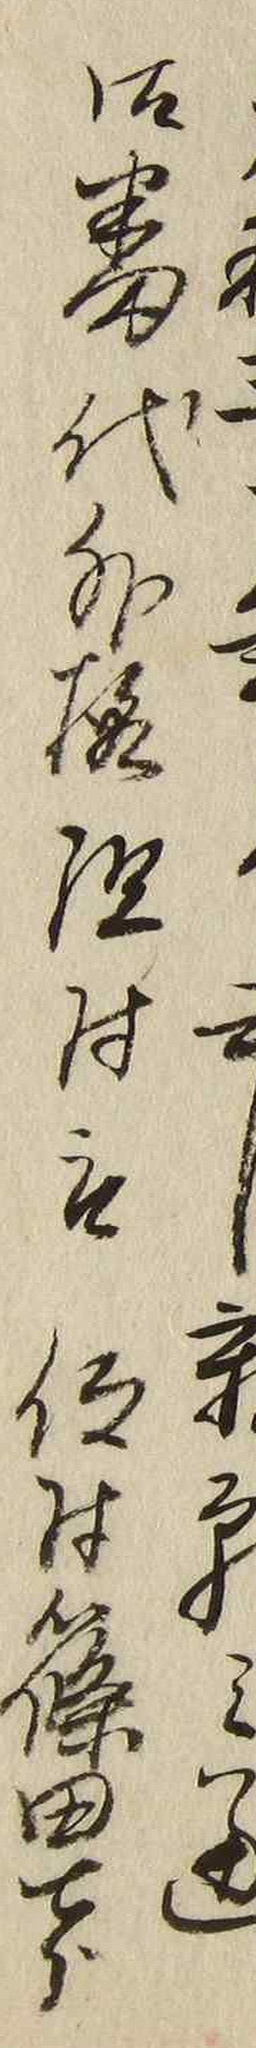御番代外様組付被仰付篠田七郎

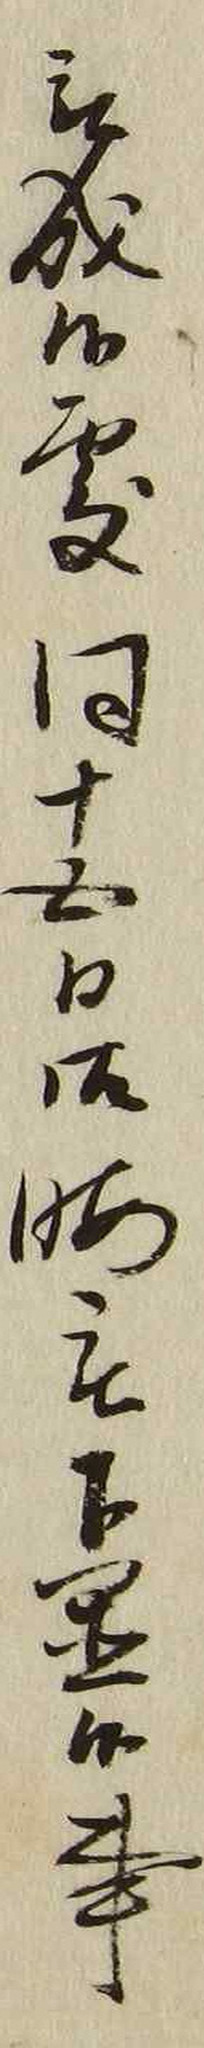被成候処同十五日御暇被下置候事
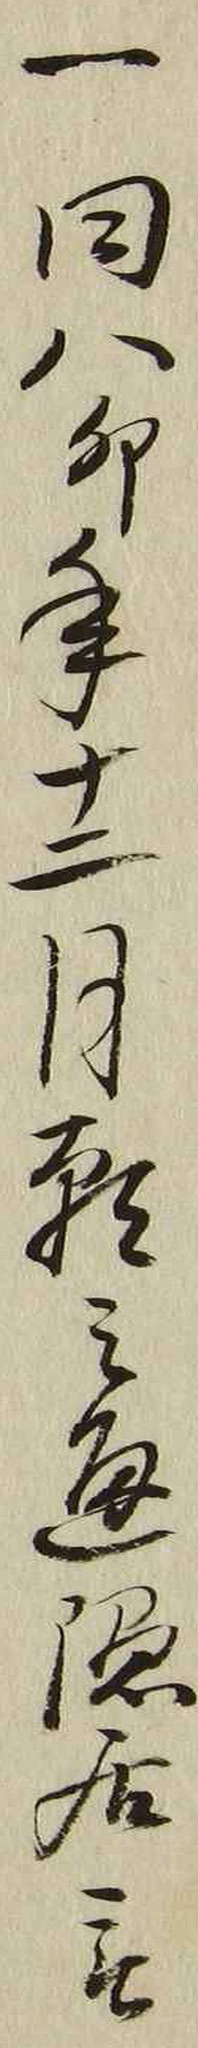一同八卯年十二月願之通隠居被
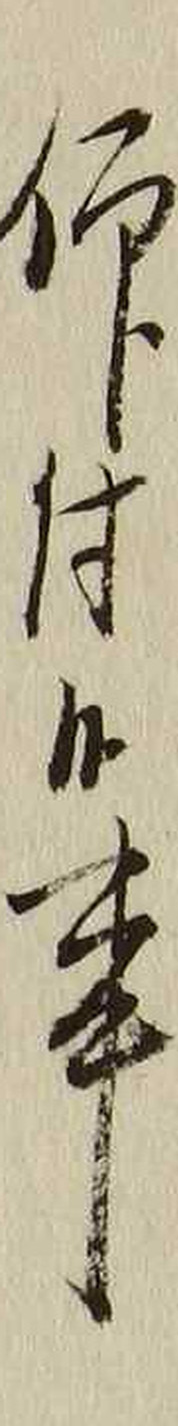仰付候事
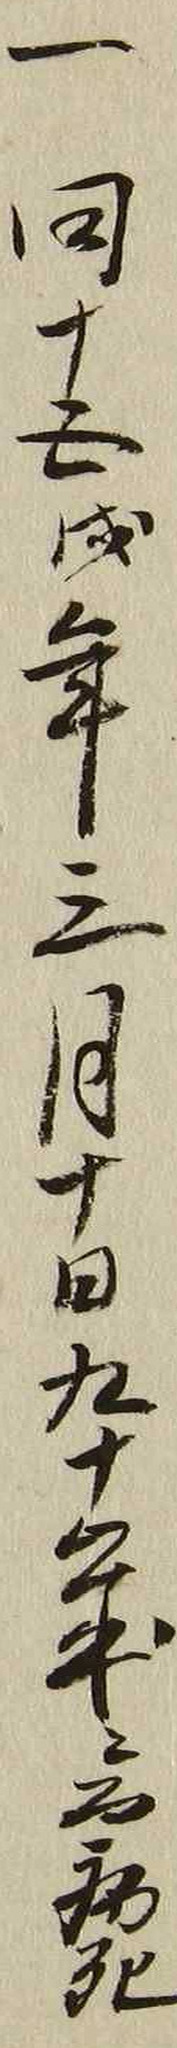一同十五戌年三月十日九十歳ニ而病死
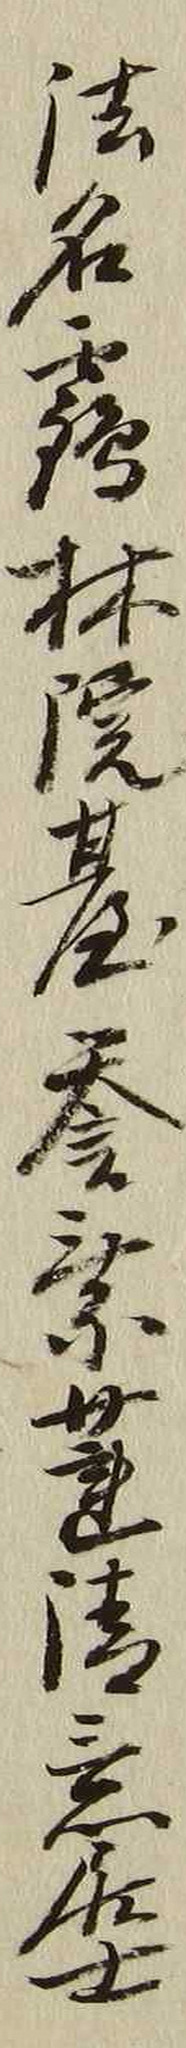法名鶴林院台誉乗蓮清意居士
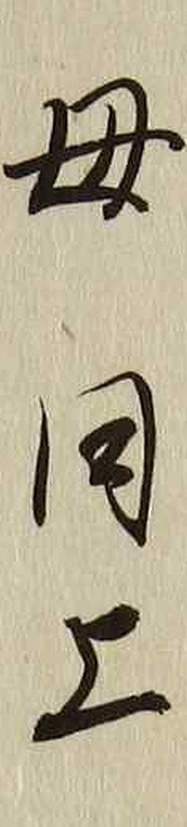母同上
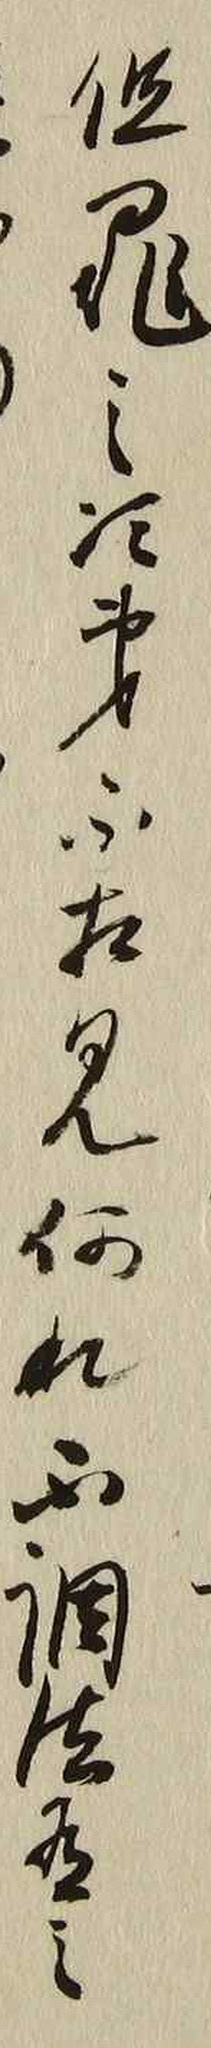但罪之次第不相見何れ不調法有之
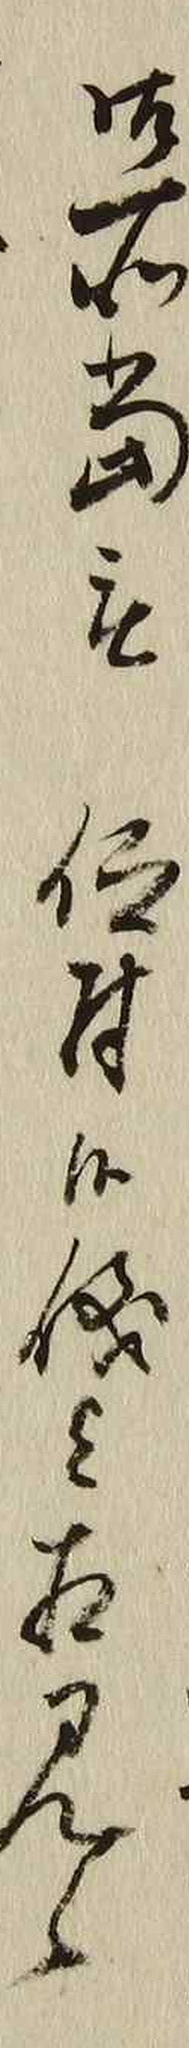御所当被仰付候儀与相見候
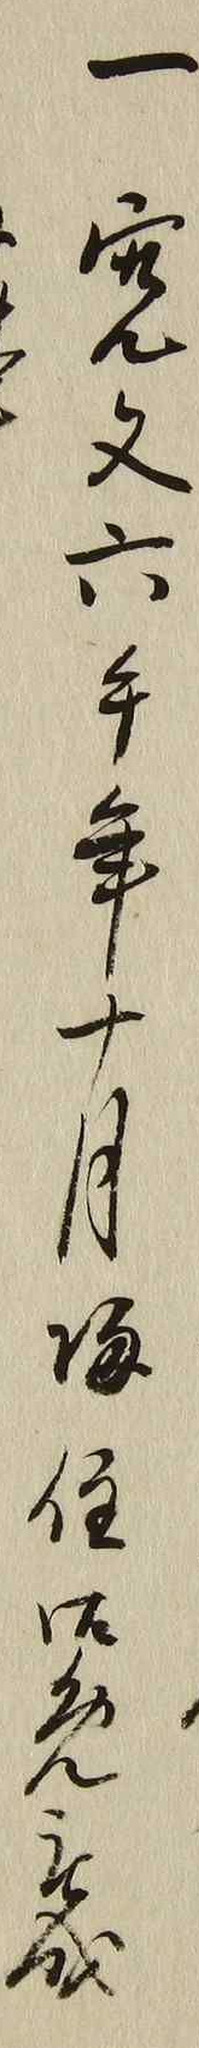一寛文六午年十月帰住御免被成
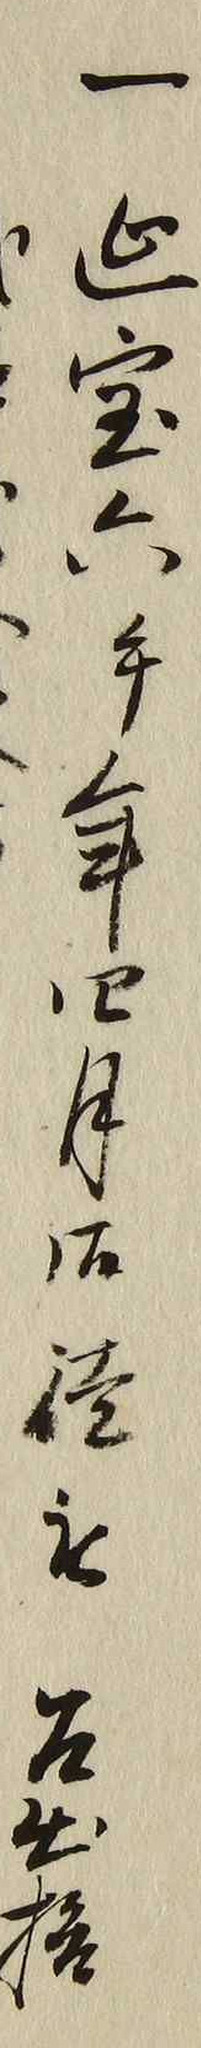一延宝六午年四月御徒被召出拾
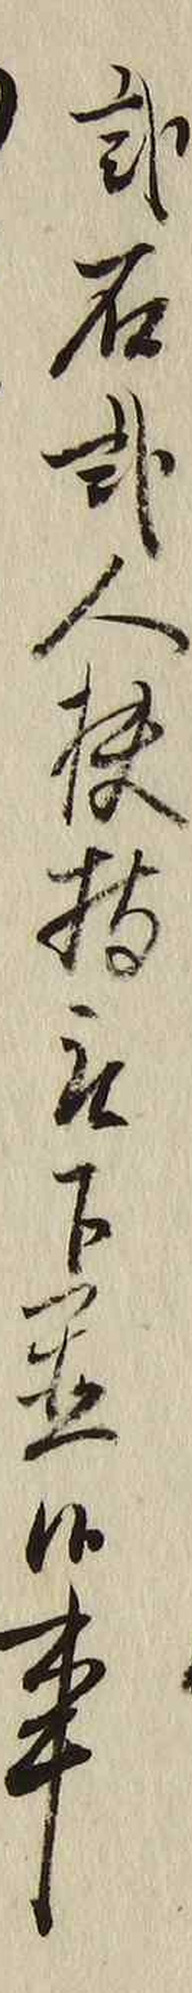弐石弐人扶持被下置候事
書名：諸士系譜　巻之348　も之部4
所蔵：会津若松市立会津図書館
